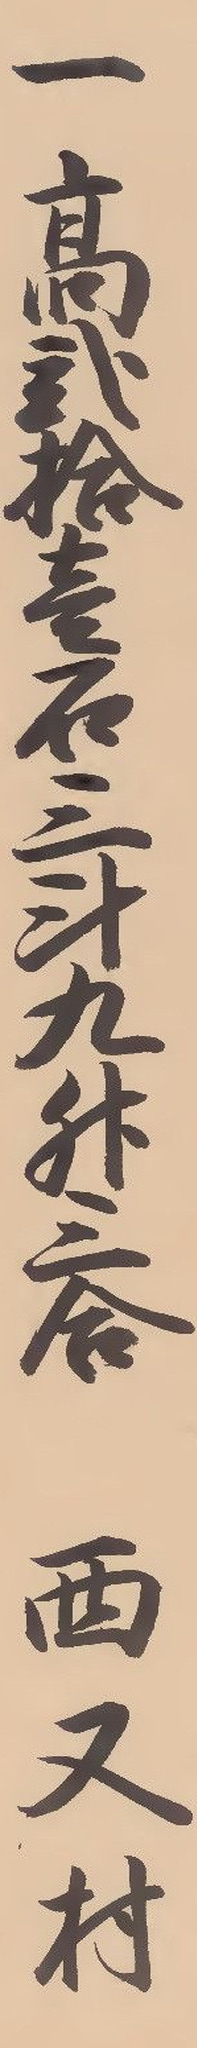一髙弐拾壱石三斗九升三合西又村
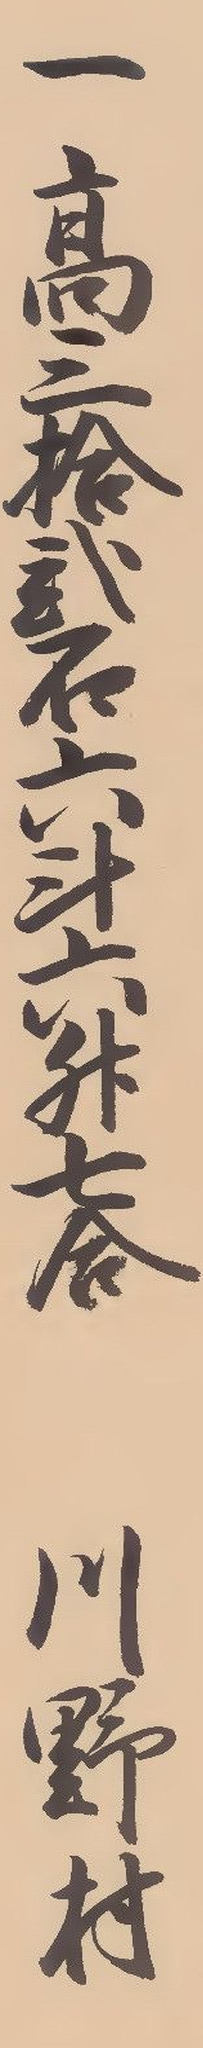一髙三拾弐石六斗六升七合川野村

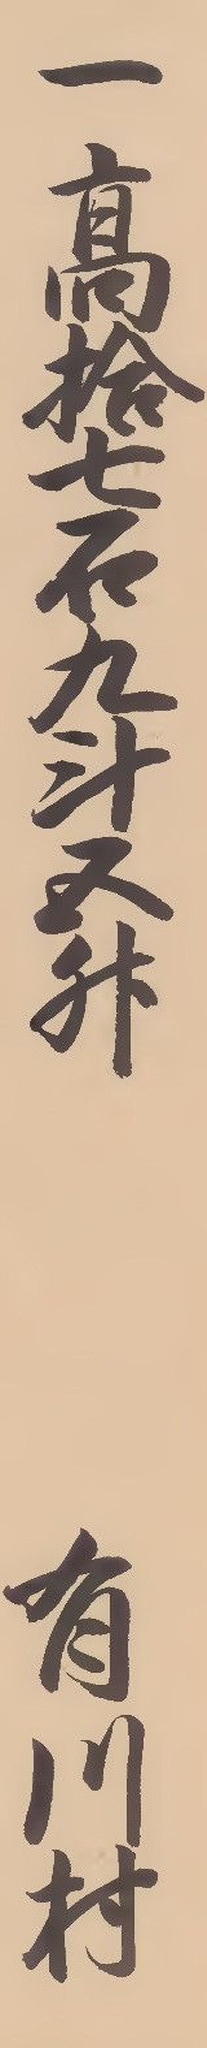一髙拾七石九斗五升有川村
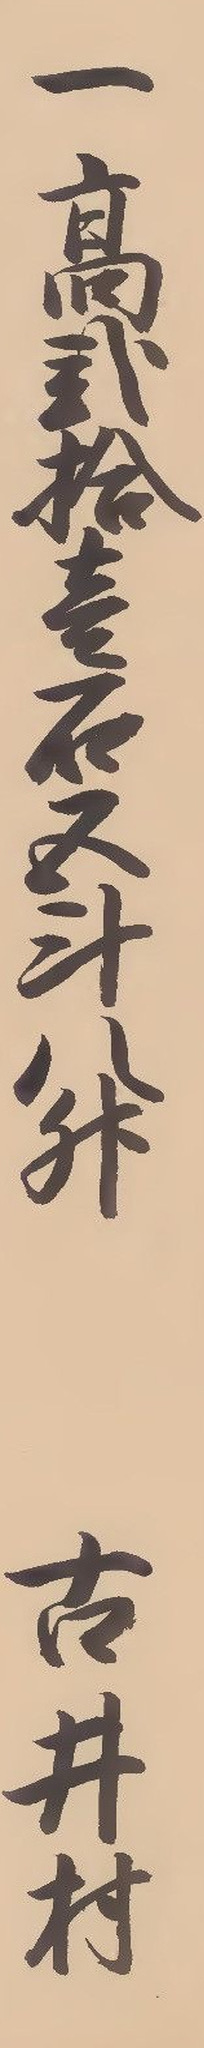一髙弐拾壱石五斗八斗古井村
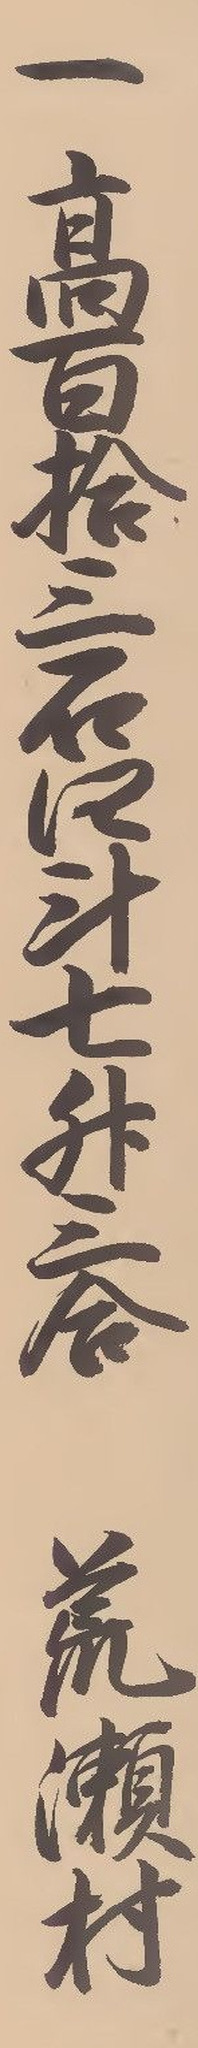一髙百拾三石四斗七升三合荒瀬村
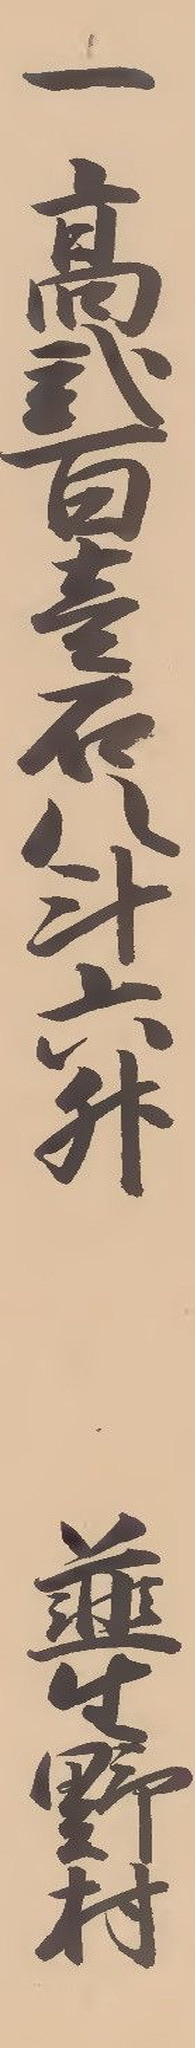一髙弐百壱石八斗六升並生野村
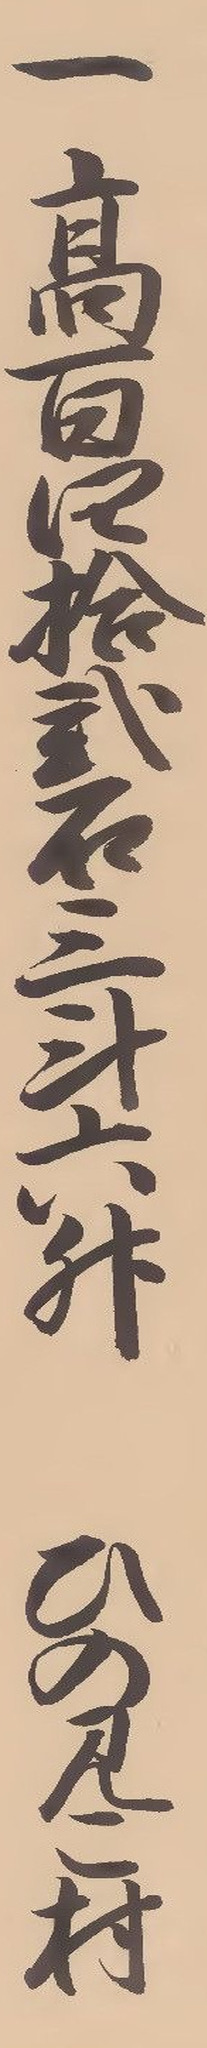一髙百四拾弐石三斗六升ひの見こ村

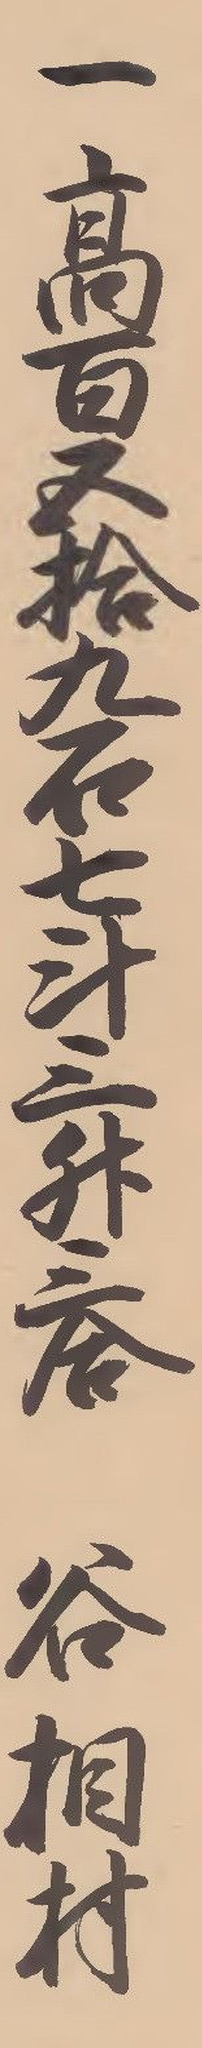一髙百五拾九石七斗三升三合谷相村
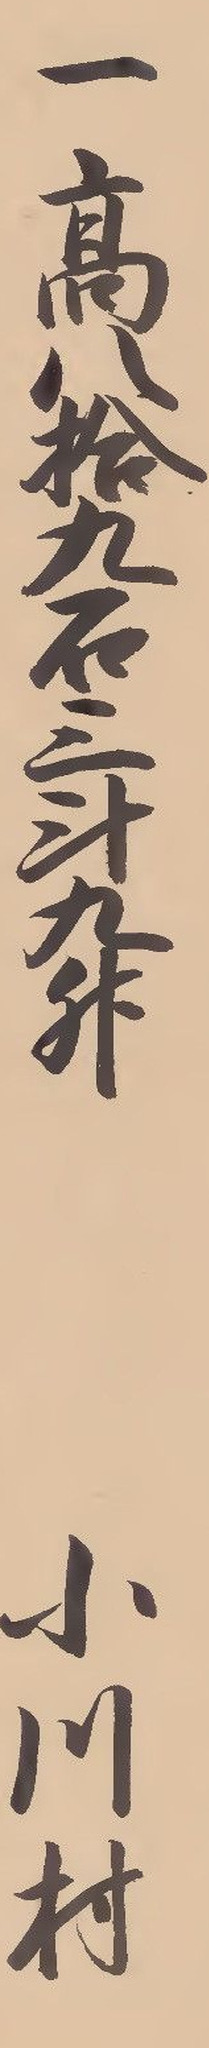一髙八拾九石三斗九升小川村
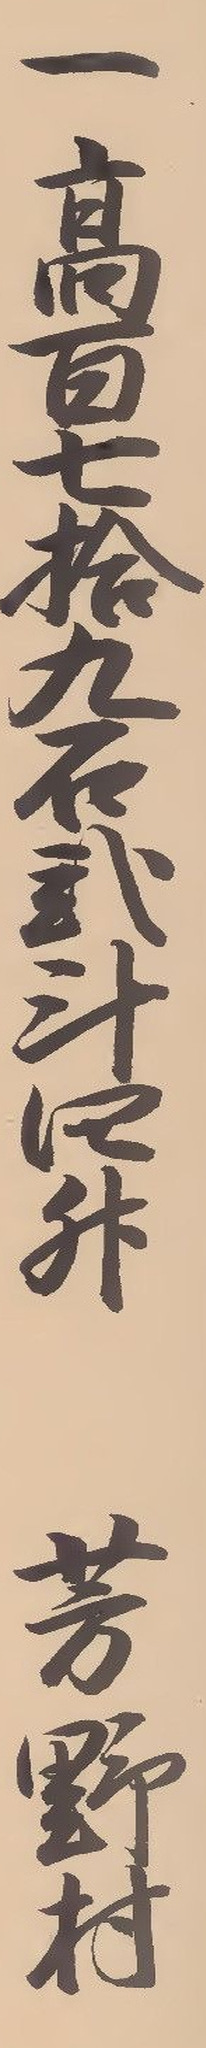一髙百七拾九石弐斗四升芳野村
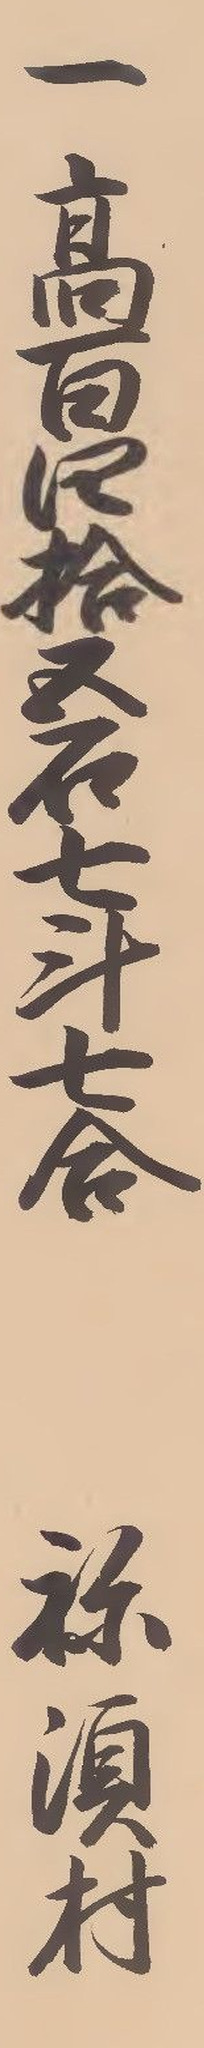一髙百四拾五石七斗七合須村
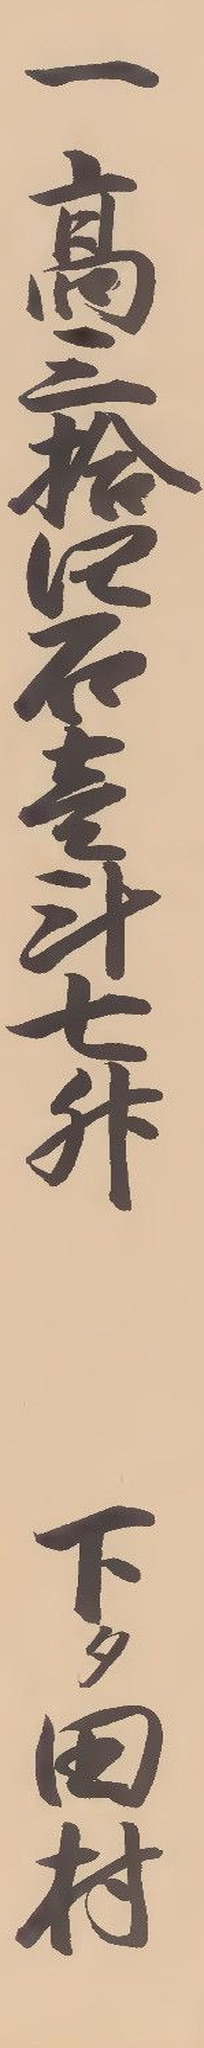一髙三拾四石壱斗七升下タ田村
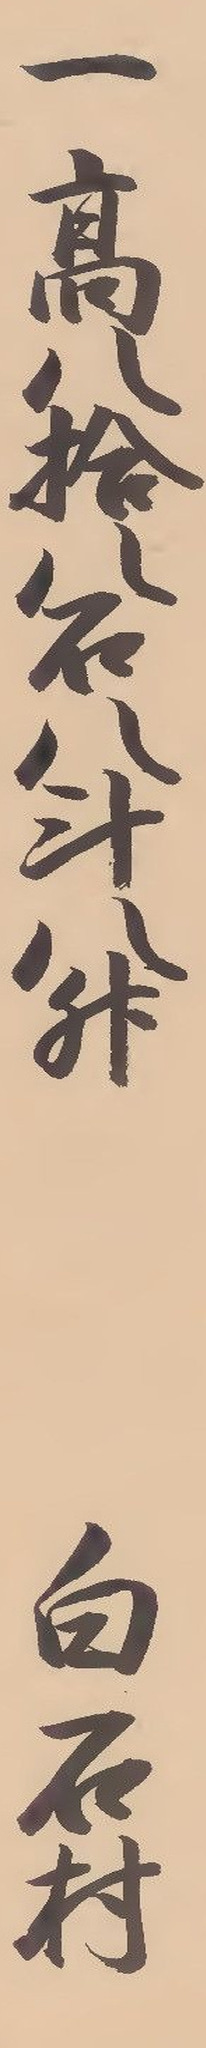一髙八拾八石八斗八升白石村

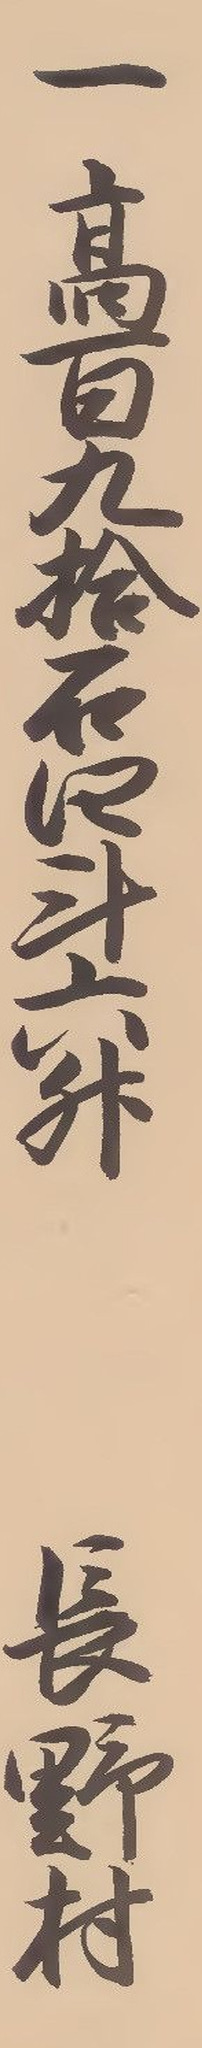一髙百九拾石四斗六升長野村
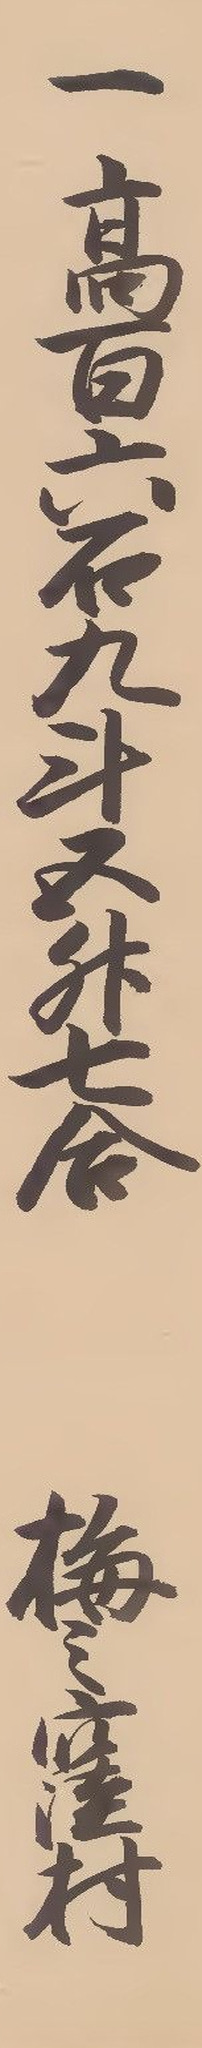一髙百六石九斗五升七合梅之窪村
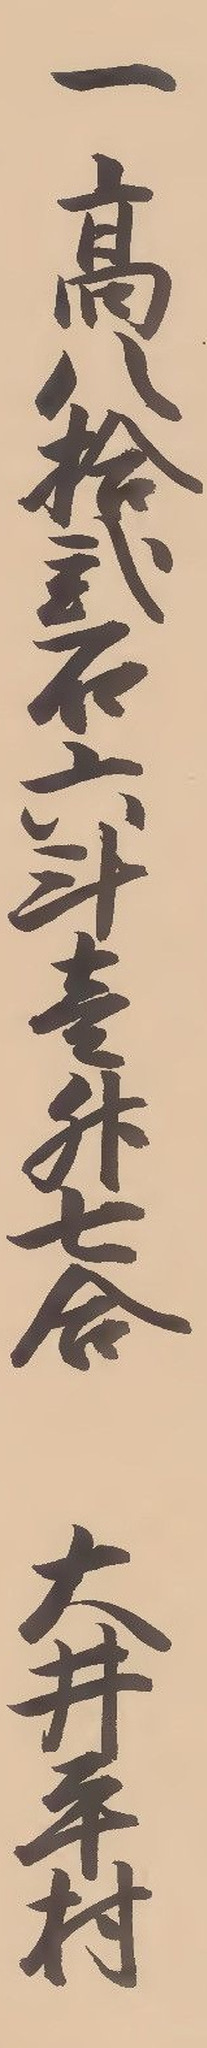一髙八拾弐石六斗壱升七合大井平村
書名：土佐国郷帳
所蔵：国立公文書館 National Archives of Japan
